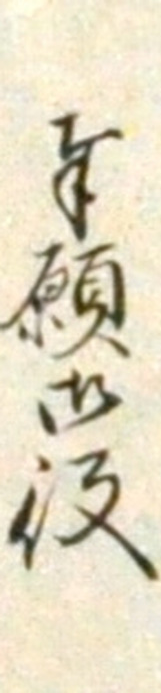奉願御役
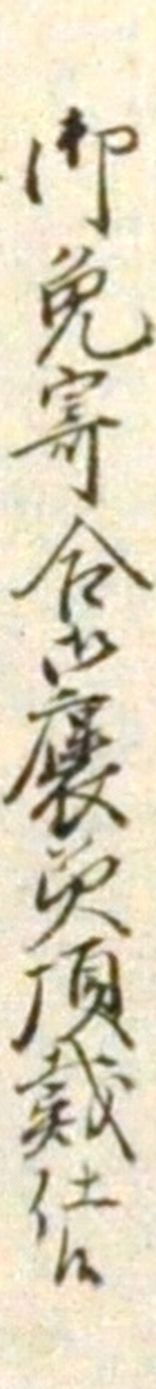御免寄合御褒美頂戴仕候
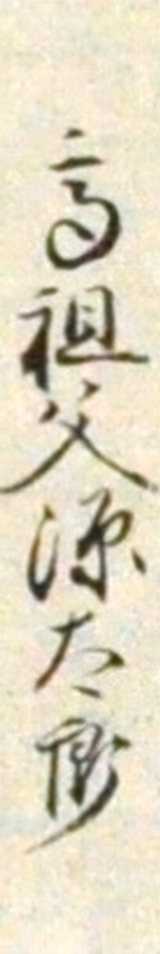高祖父源太郎
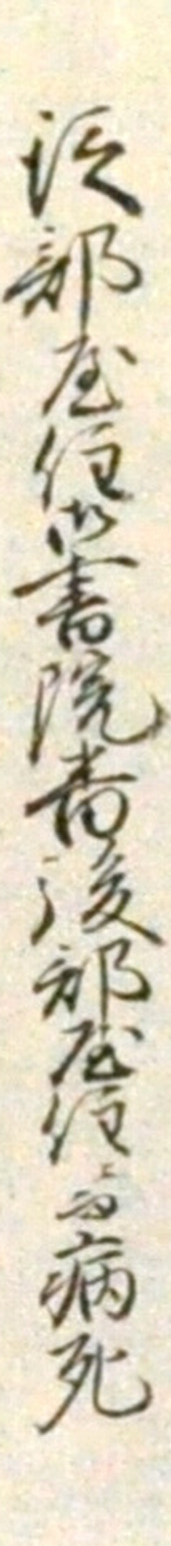従部屋住御書院番後部屋住ニ而病死
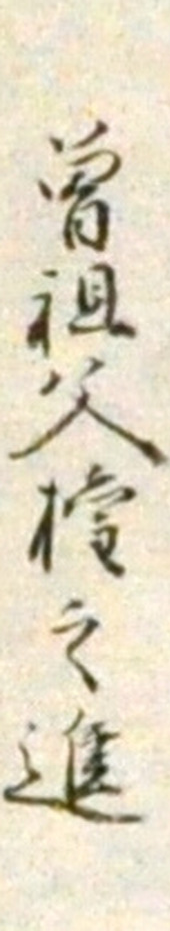曽祖父権之進
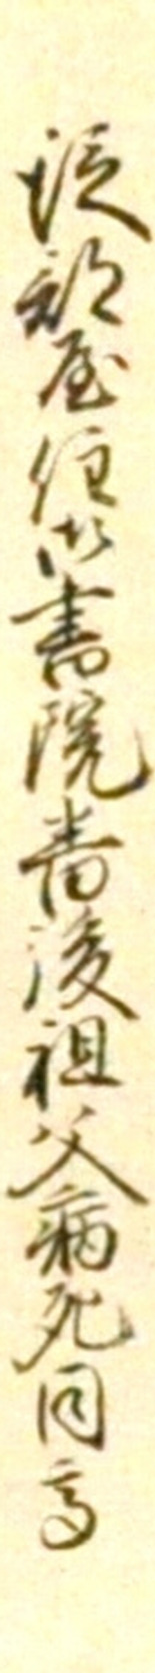従部屋住御書院後祖父病死同高
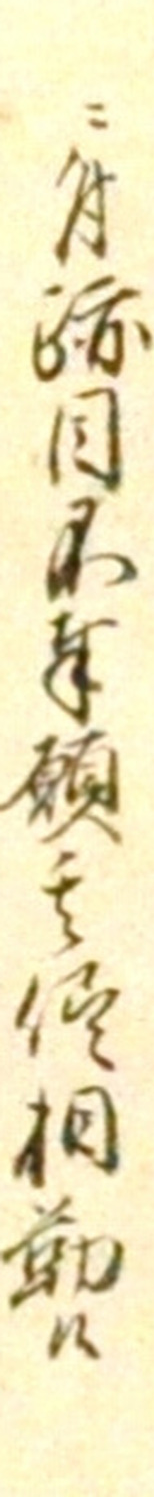ニ付跡目不奉願其侭相勤候
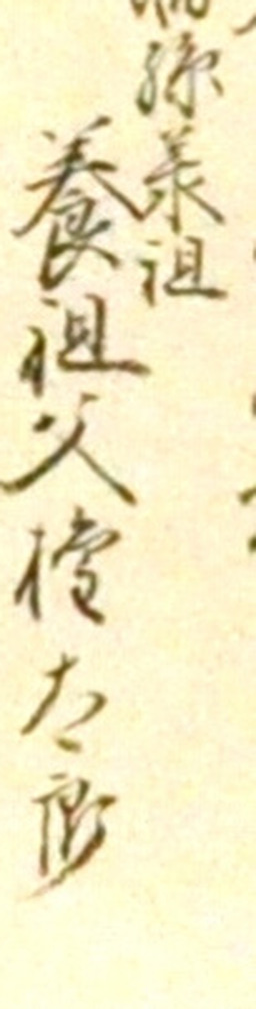養祖父権太郎
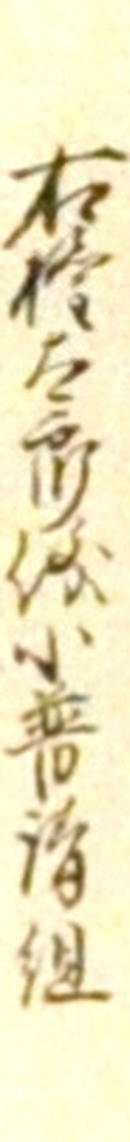右権太郎儀小普請組

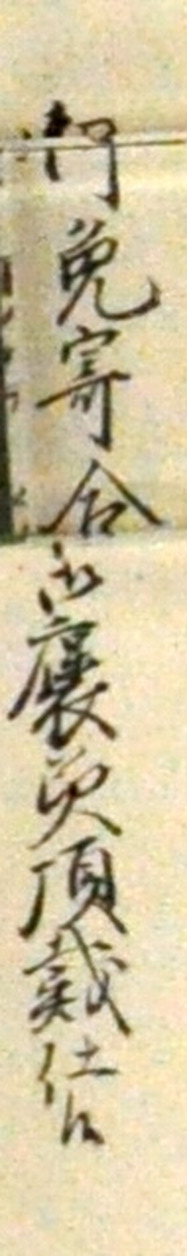御免寄合御褒美頂戴仕候
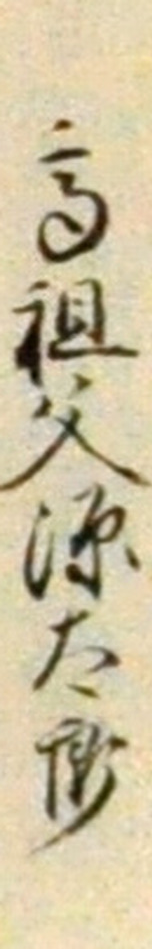高祖父源太郎
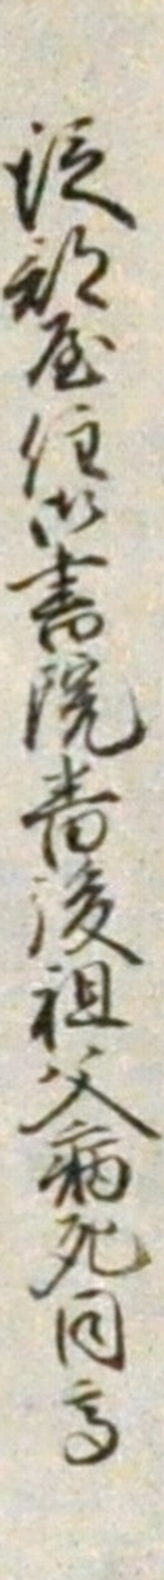従部屋住御書院後祖父病死同高
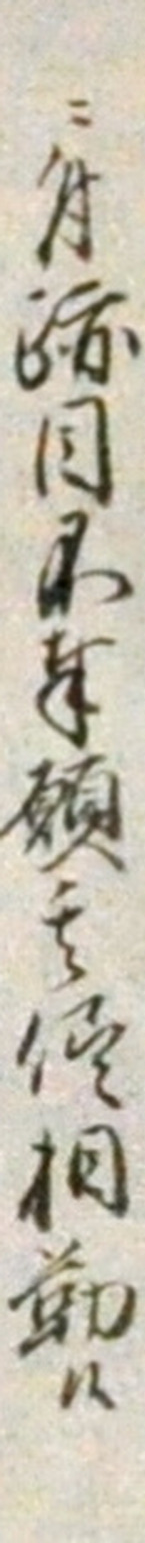ニ付跡目不奉願其侭相勤候
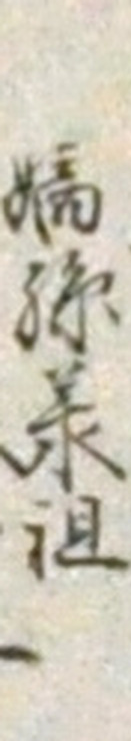嫡孫承祖
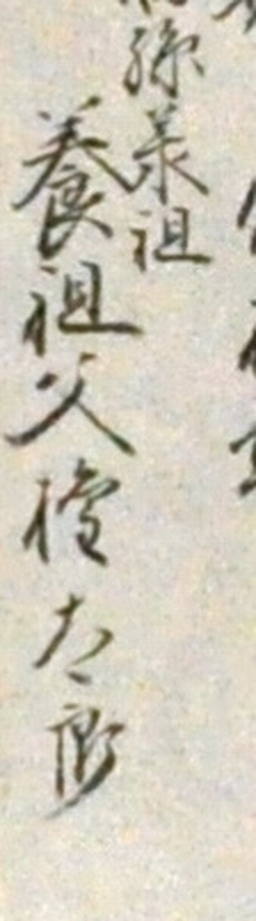養祖父権太郎
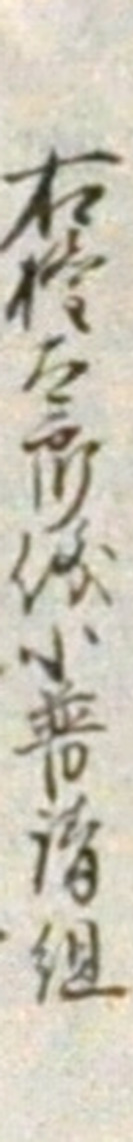右権太郎儀小普請組
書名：若年寄御役中御調書付
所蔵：伊那市立高遠町図書館・合同会社AMANE
